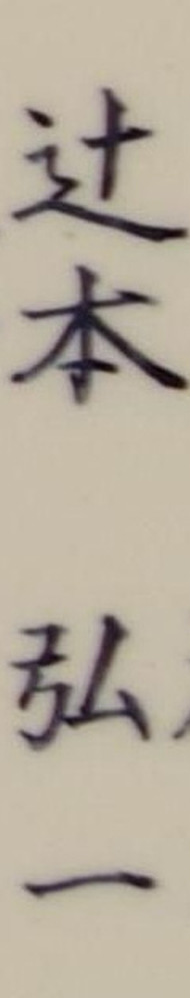辻本弘一
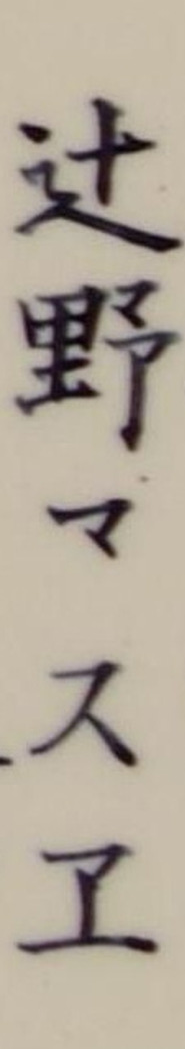辻野マスエ
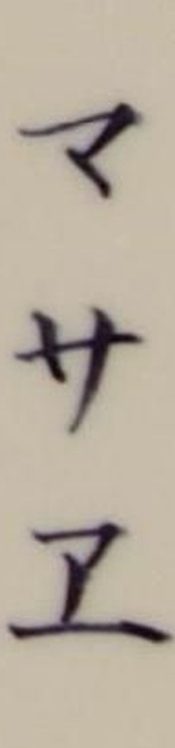マサエ
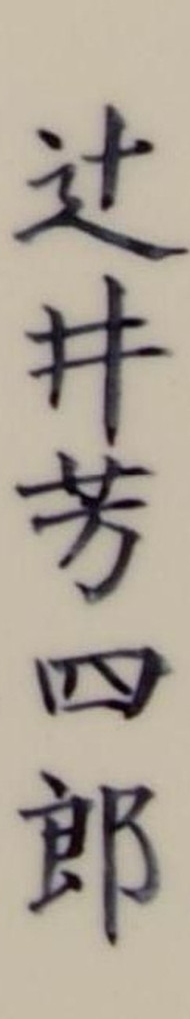辻井芳四郎
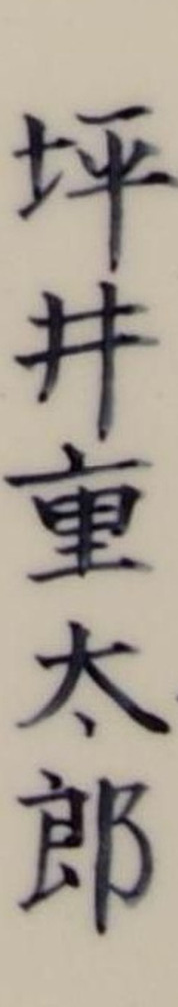坪井重太郎
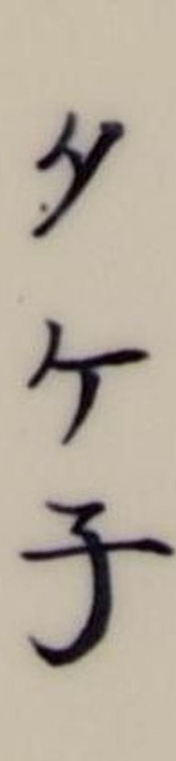タケ子
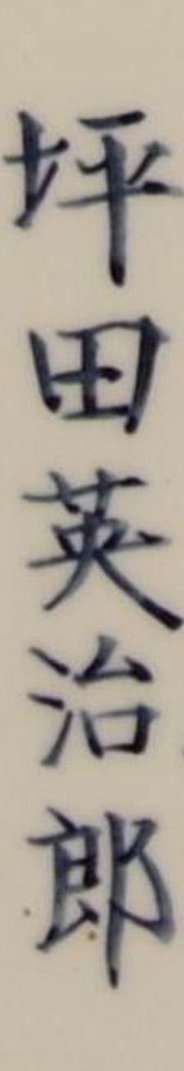坪田英治郎
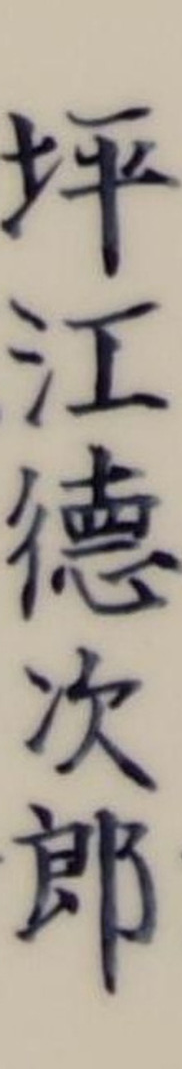坪江徳次郎
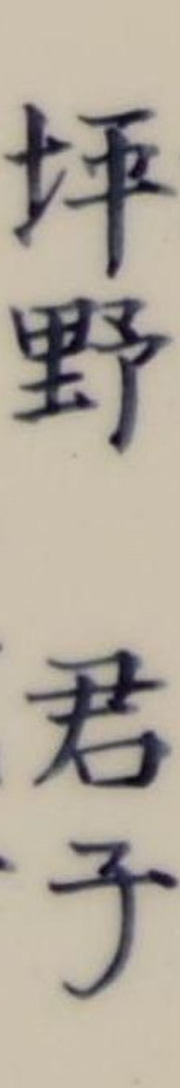坪野君子
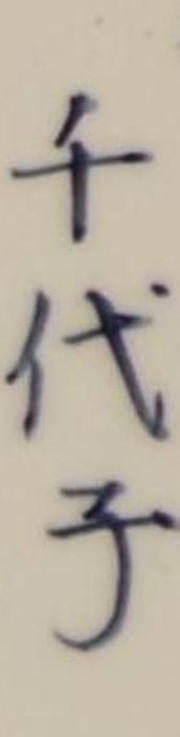千代子

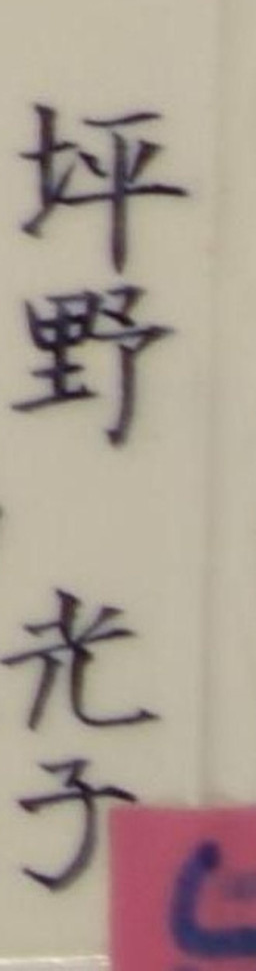坪野光子
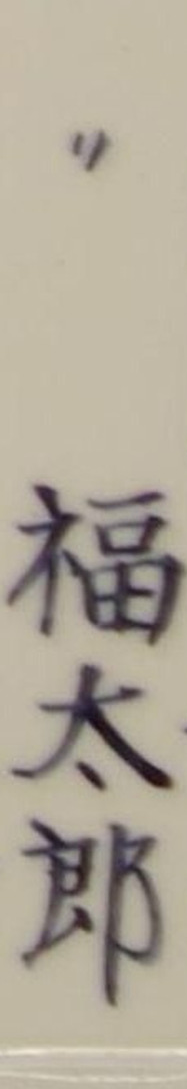福太郎
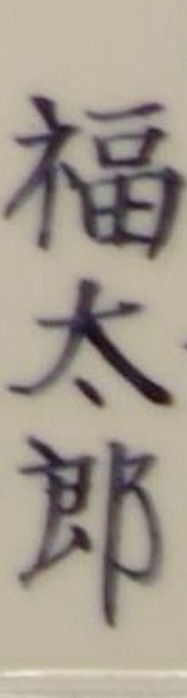福太郎
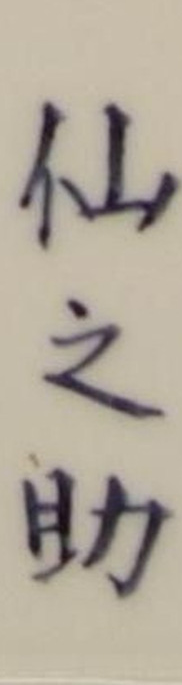仙之助
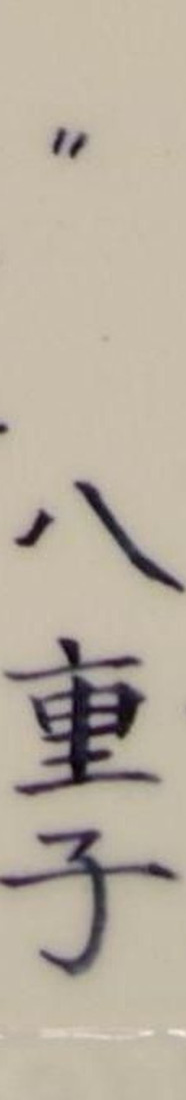八重子
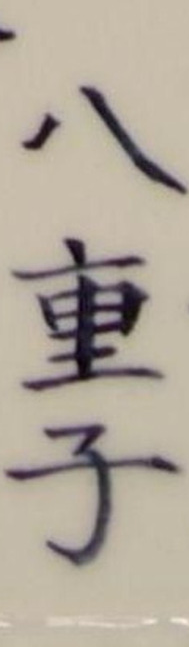八重子
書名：E~L
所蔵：高野山金剛峯寺
